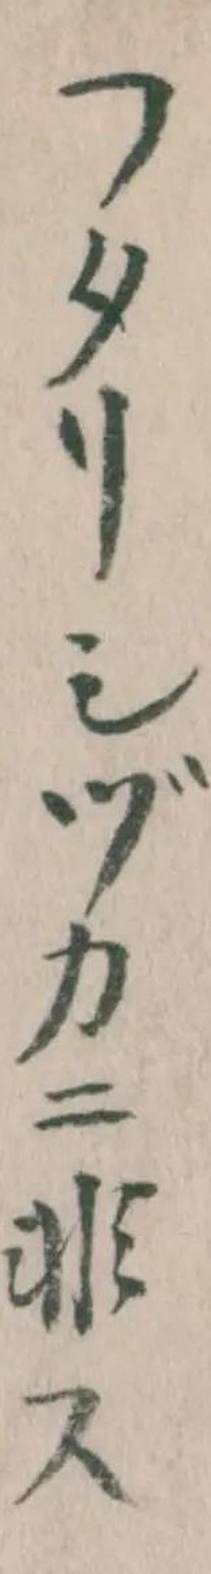フタリシヅカニ非ス
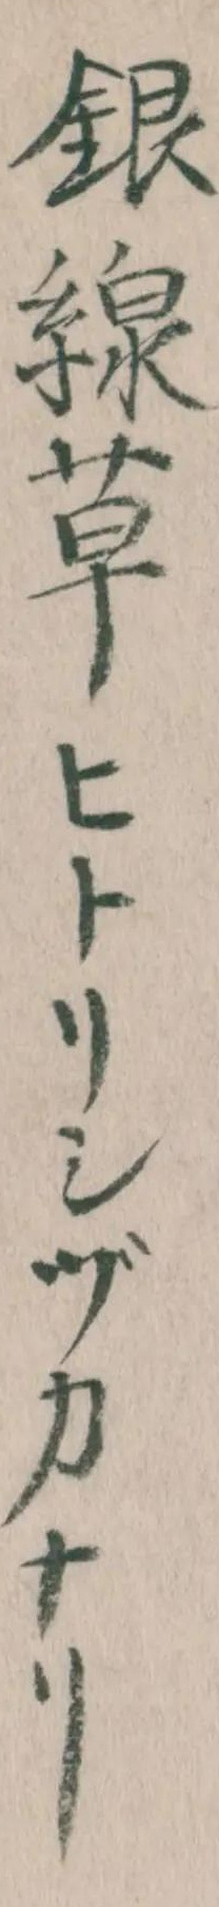銀線草ヒトリシヅカナリ

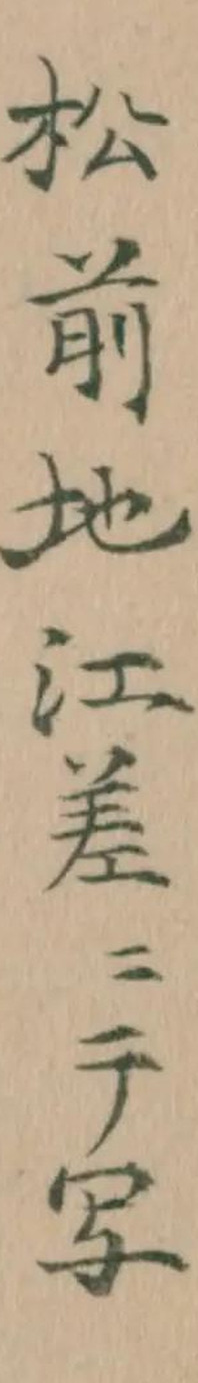松前地江差ニテ写

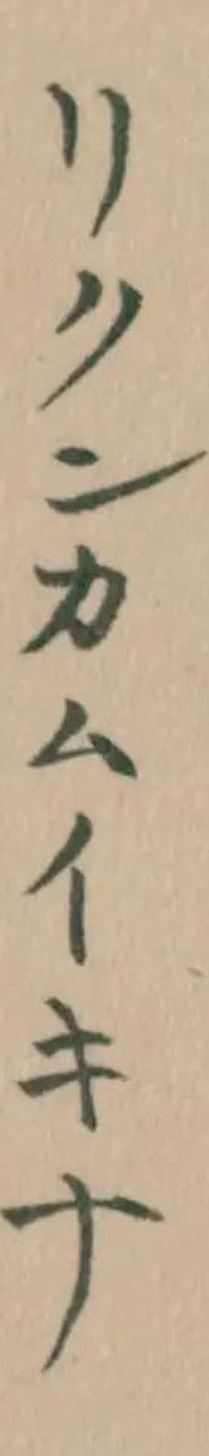リクンカムイキナ
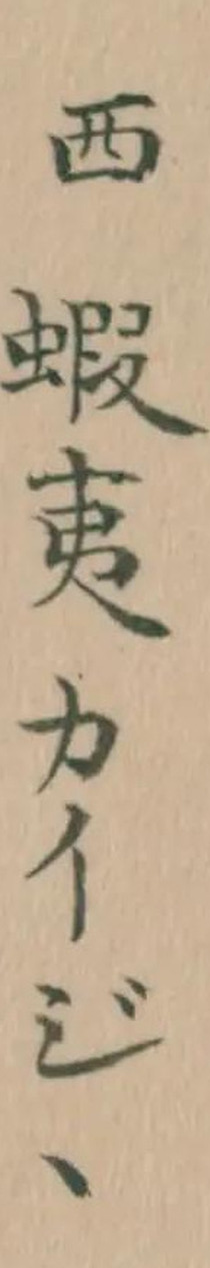西蝦夷カイジヽ
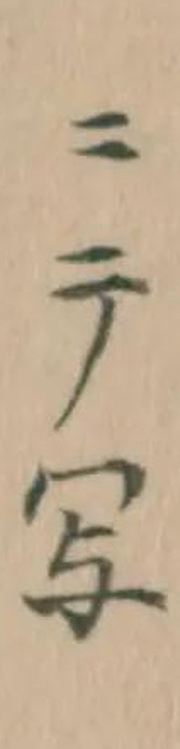ニテ写
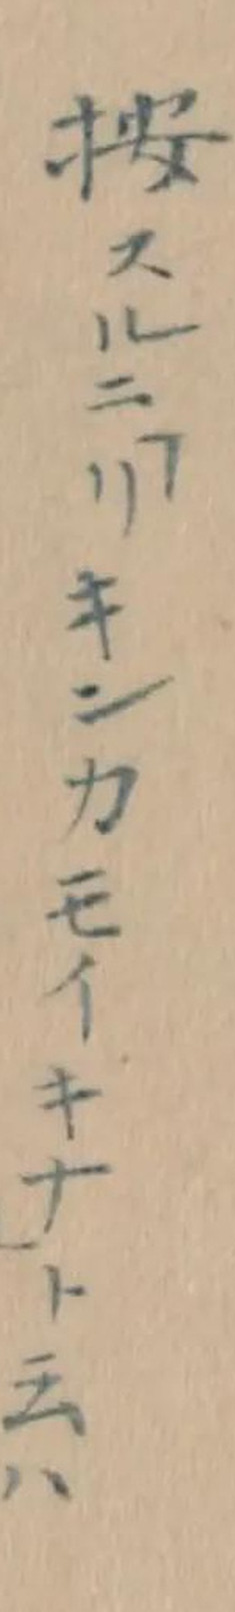按スルニ「リキンカモイキナ」ト云ハ
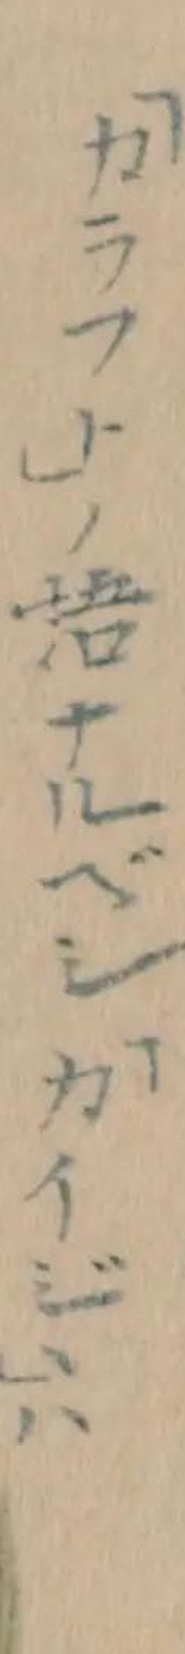「カラフト」ノ語ナルベシ「カイジヽ」ハ
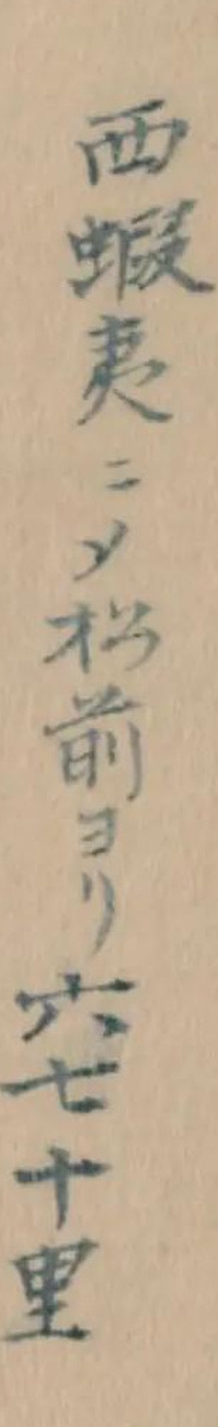西蝦夷ニシテ松前ヨリ六七十里
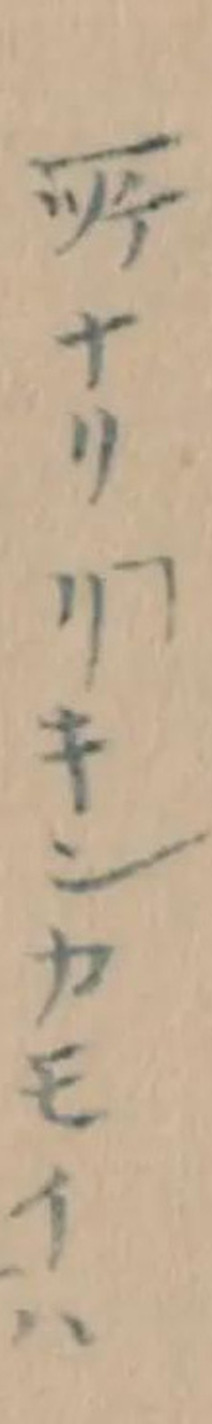所ナリ「リキンカモイ」ハ
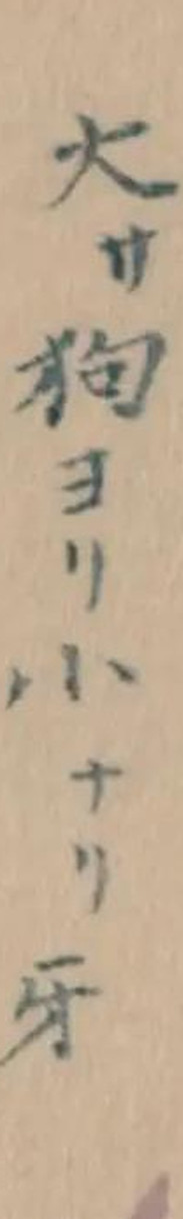大サ狗ヨリ小ナリ牙
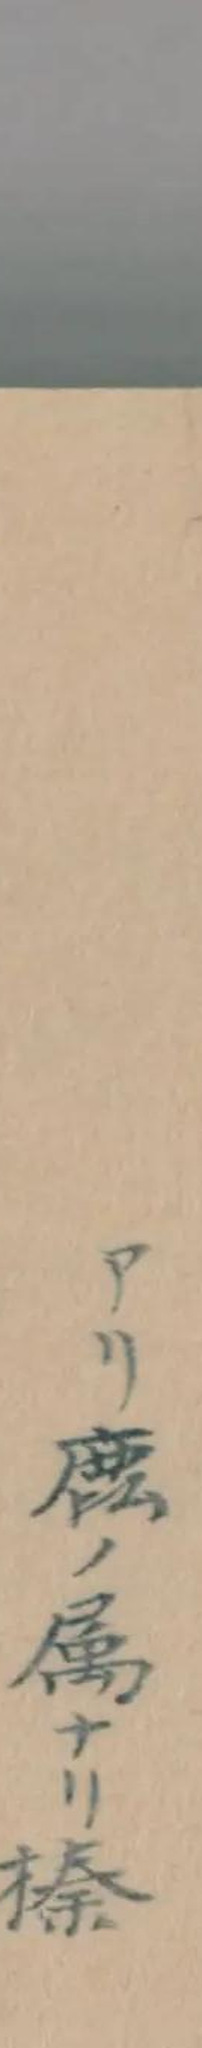アリ鹿ノ属ナリ棒
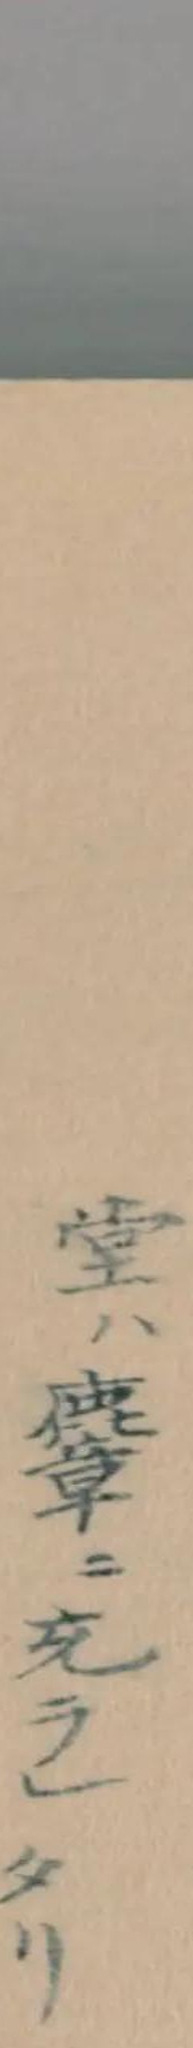堂ハ麞ニ充ラレタリ
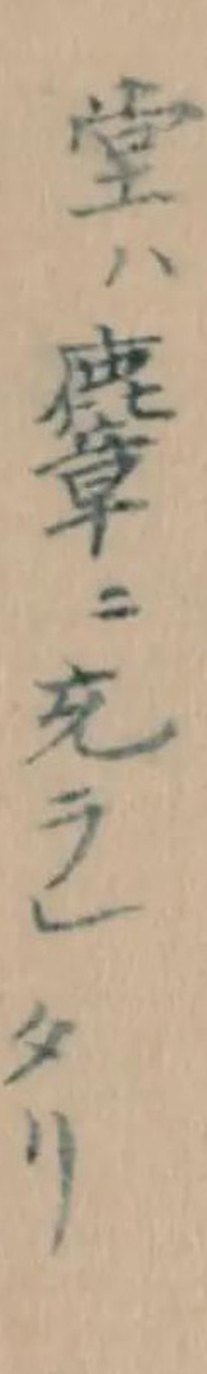堂ハ麞ニ充ラレタリ
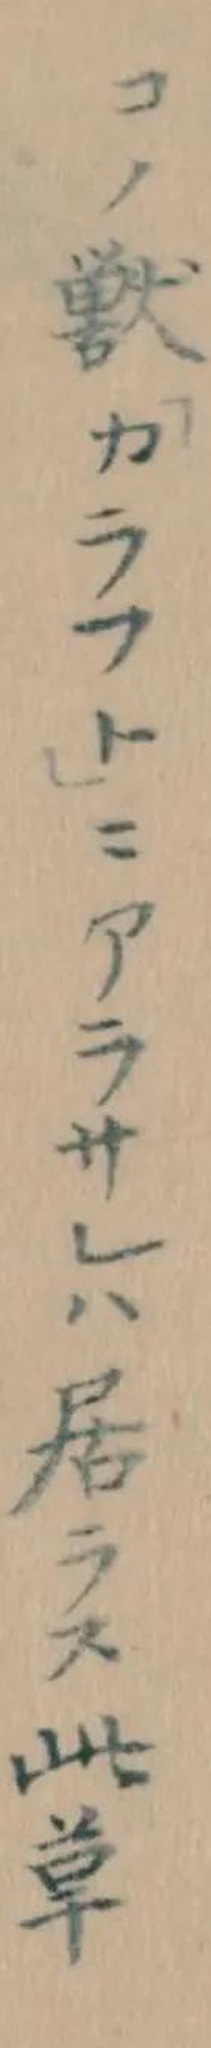コノ獣「カラフト」ニアラサレハ居ラス此草
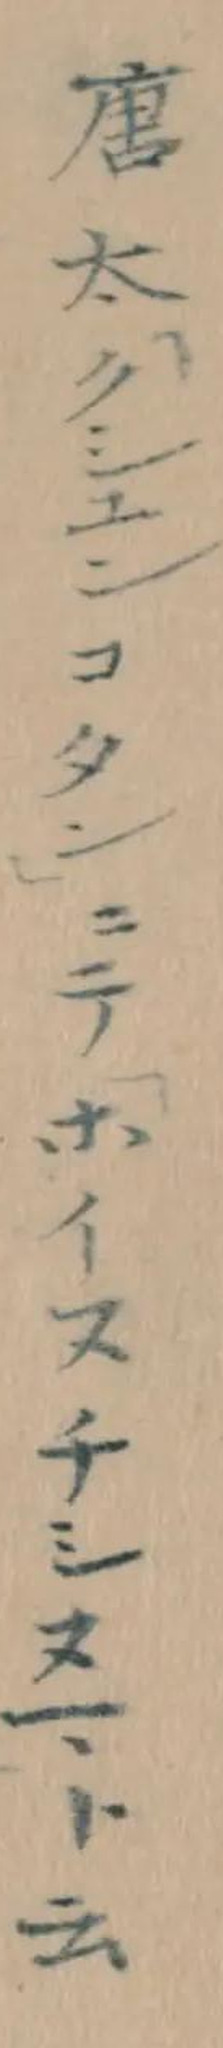唐太「クシユンコタン」ニテ「ホイヌチシヌマ」ト云
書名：蝦夷草木図
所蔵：国立国会図書館 National Diet Library, JAPAN
